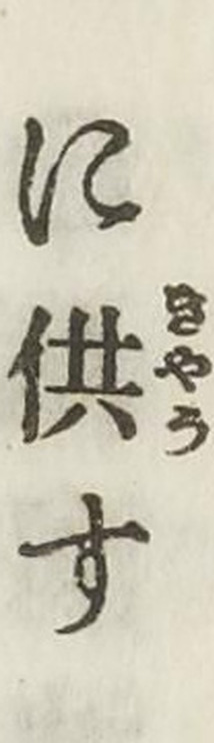に供す

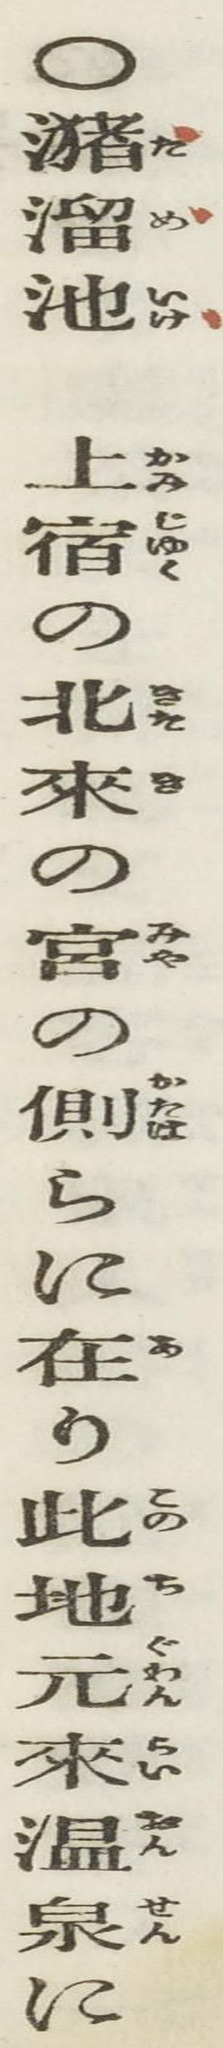○潴溜池上宿の北来の宮の側らに在り此地元来温泉に
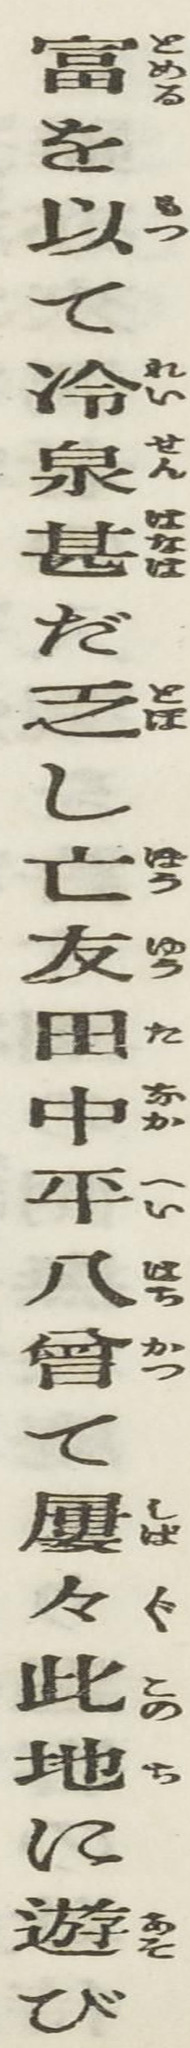富を以て冷泉甚だ乏し亡友田中平八曾て屡々此地に遊び
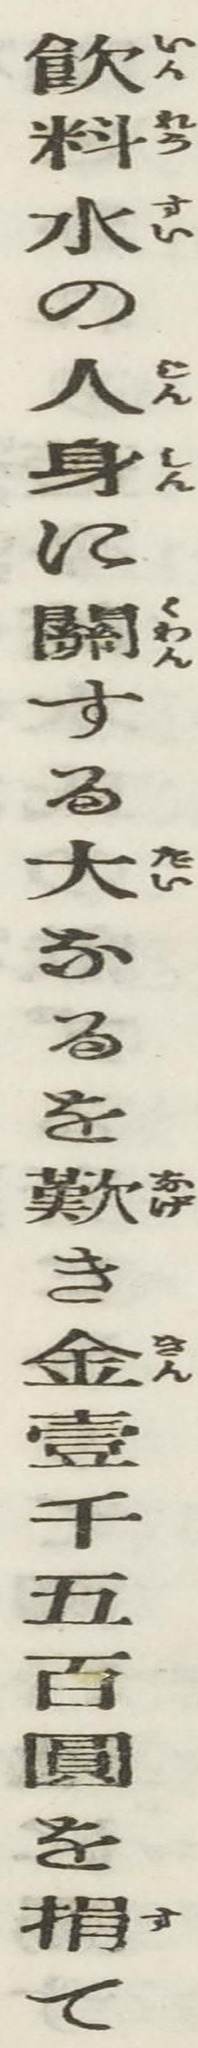飲料水の人身に関する大なるを歎き金壹千五百圓を損て
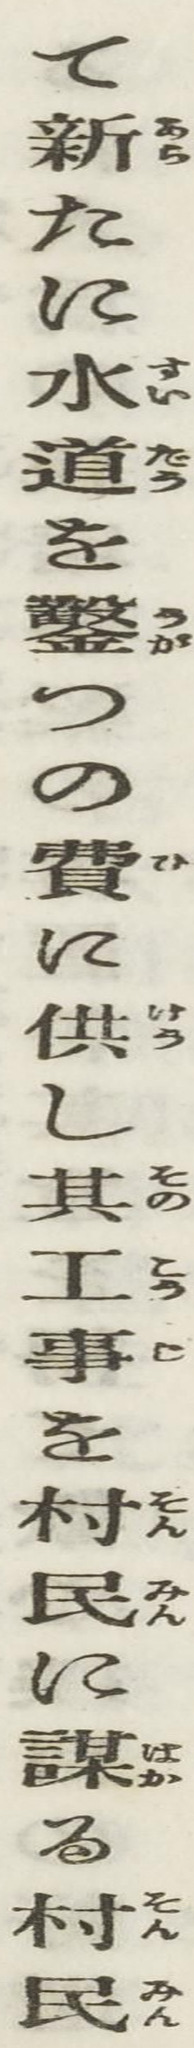て新たに水道を穿つの費に供し其工事を村民に謀る村民
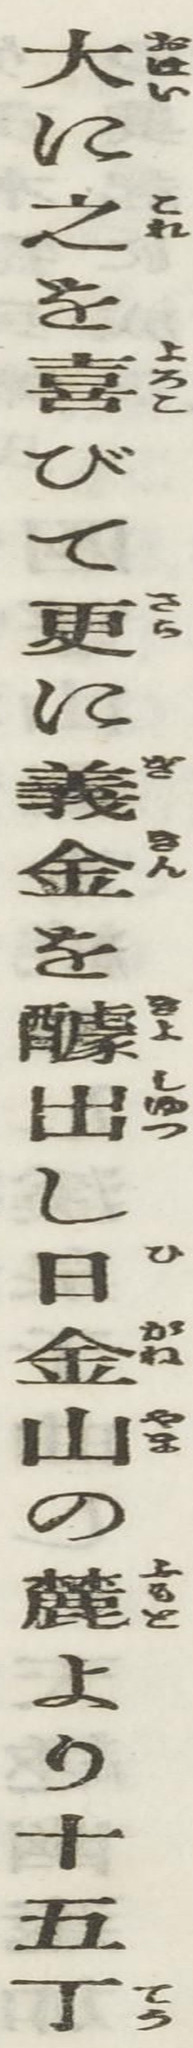大に之を喜びて更に義金を拠出し日金山の麓より十五丁
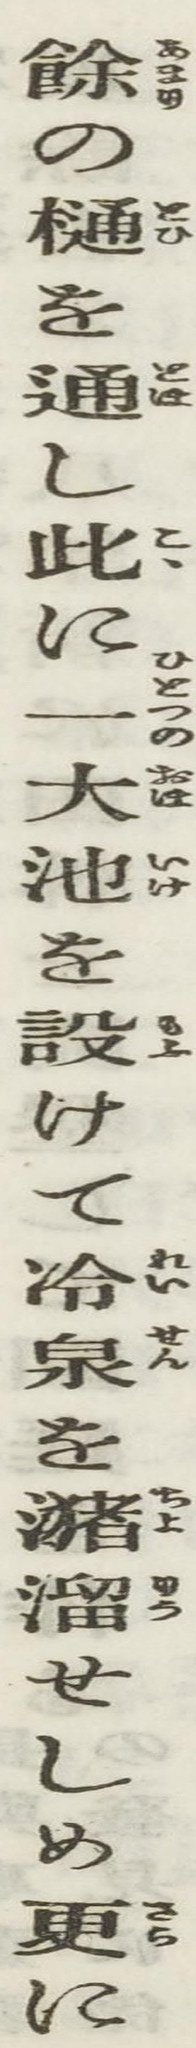餘の樋を通し此に一大池を設けて冷泉を潴溜せしめ更に
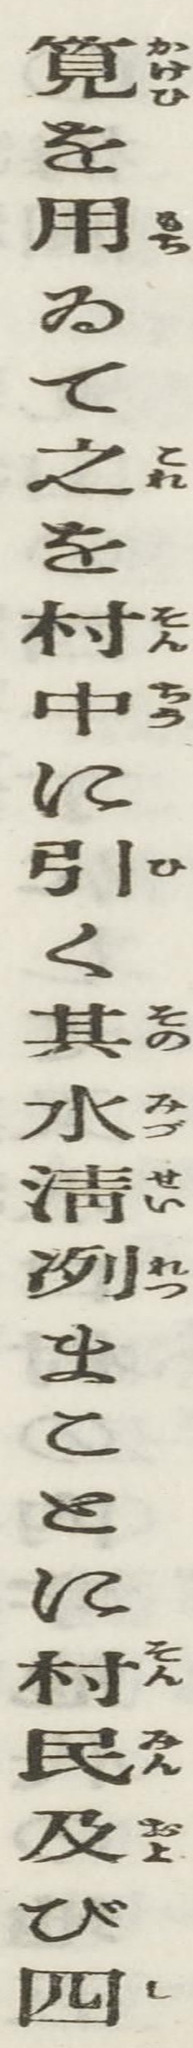筧を用ゐて之を村中に引く其水清冽まことに村民及び四
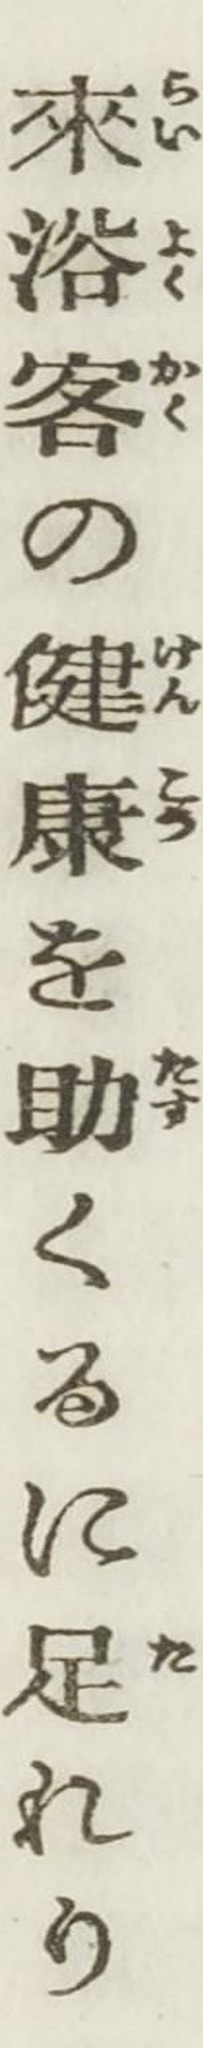来浴客の健康を助くるに足れり
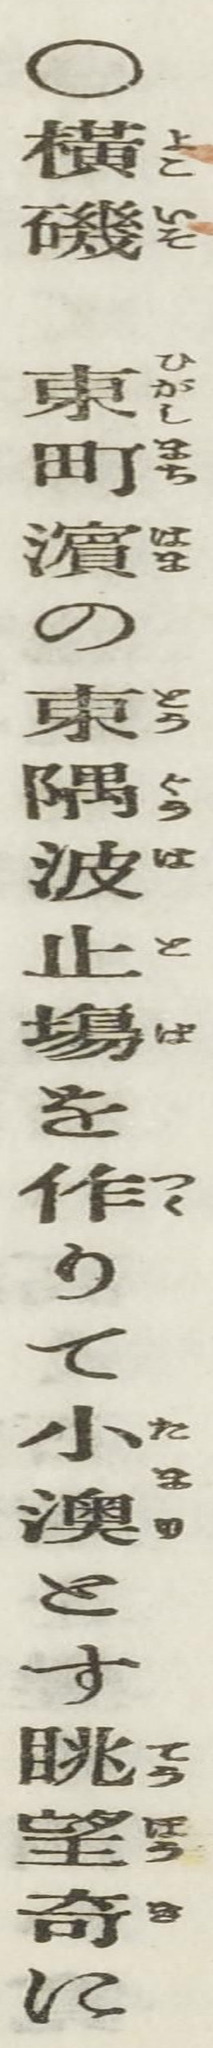○横磯東町浜の東隅波止場を作りて小澳とす眺望奇に
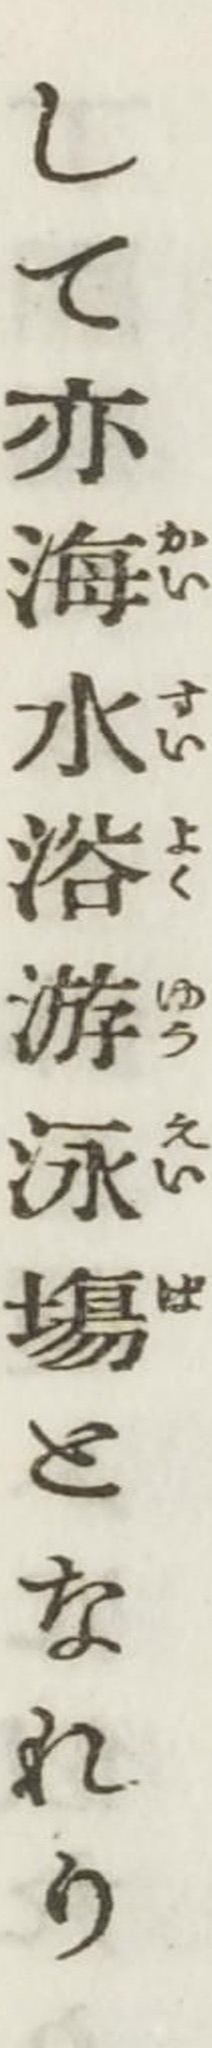して亦海水浴遊泳場となれり
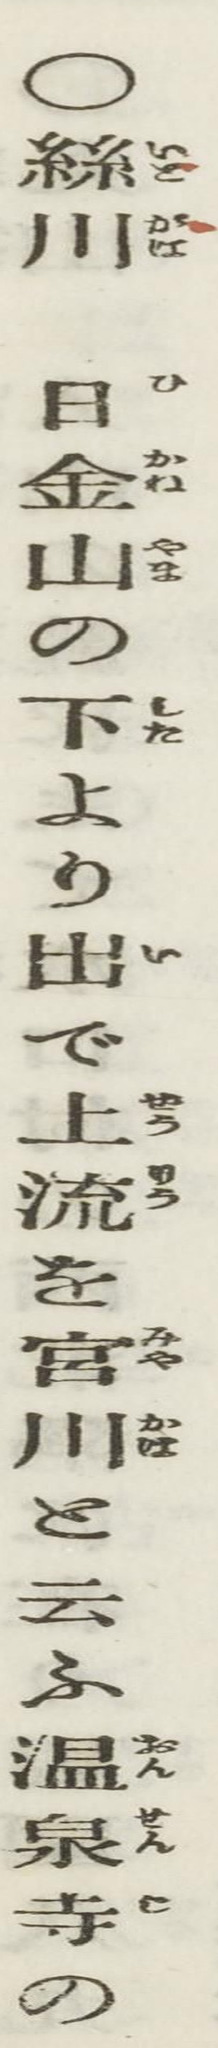○絲川日金山の下より出で上流を宮川と云ふ温泉寺の
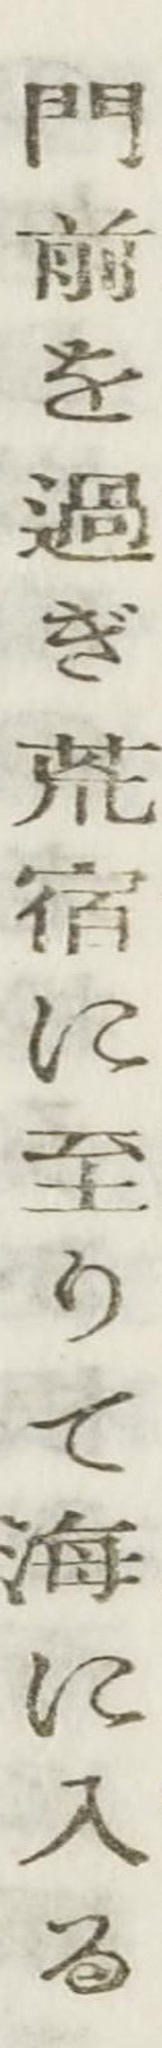門前を過ぎ荒宿に至りて海に入る
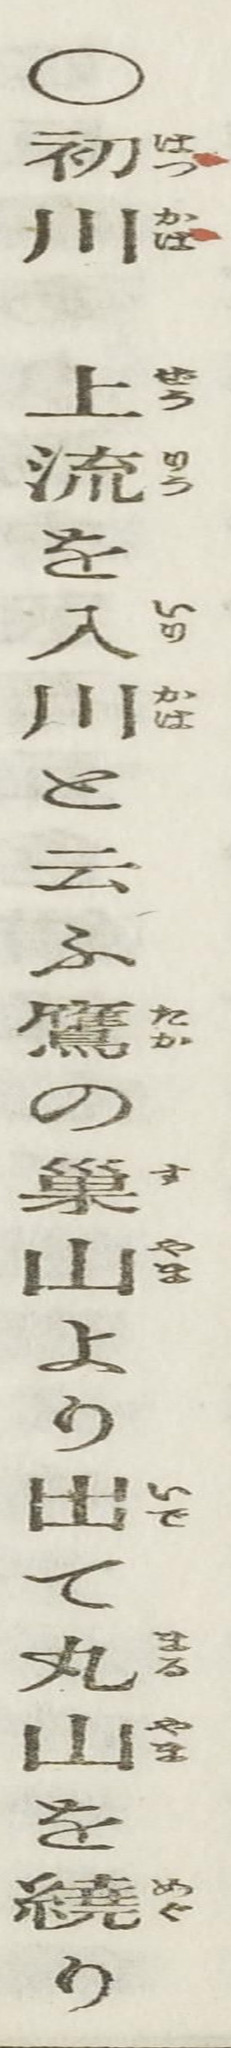○初川上流を入川と云ふ鷹の巣山より出て丸山を繞り
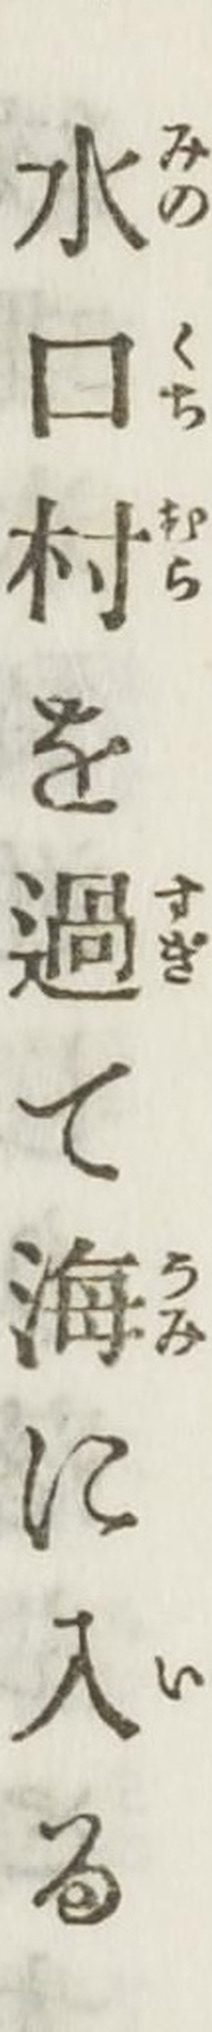水口村を過て海に入る
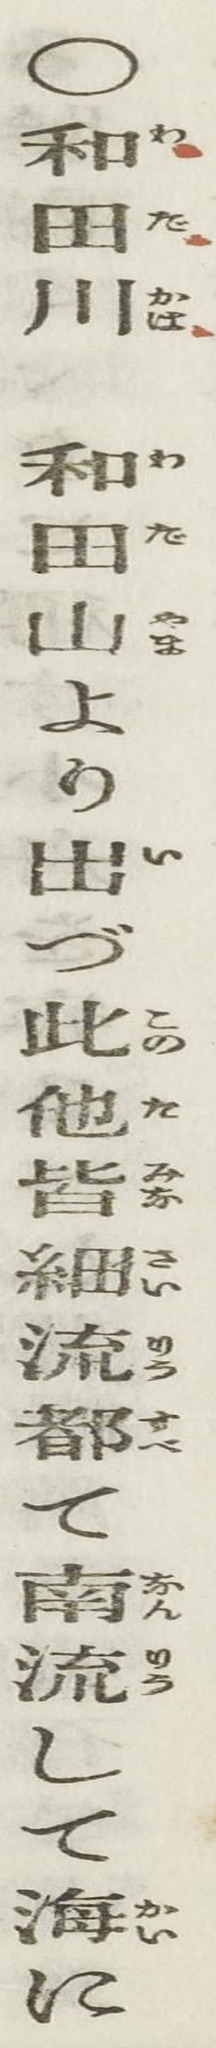○和田川和田山より出づ此他皆細流都て南流して海に
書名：熱海獨案内　全
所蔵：東京大学地震研究所図書室 Earthquake Research Institute Library, The University of Tokyo, JAPAN
